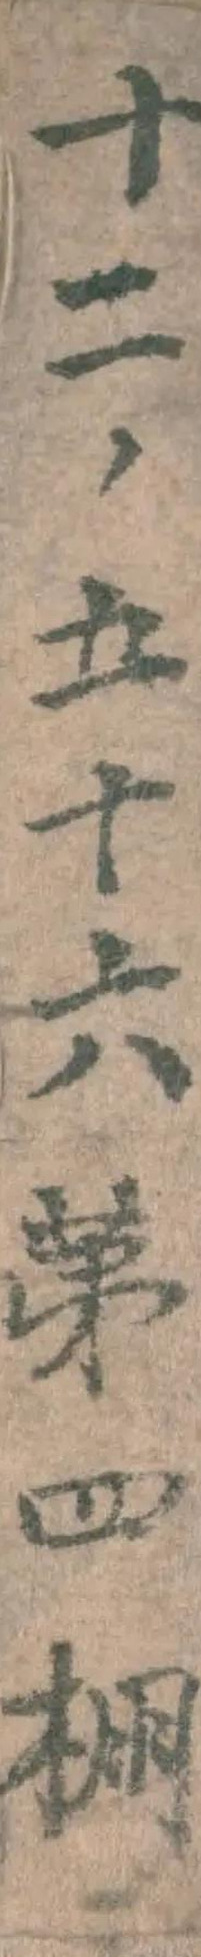『十二ノ五十六第四棚』
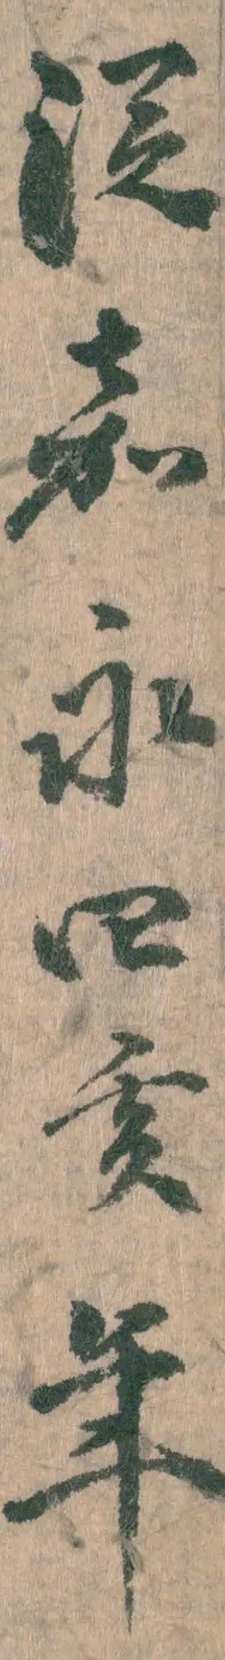従嘉永四亥年
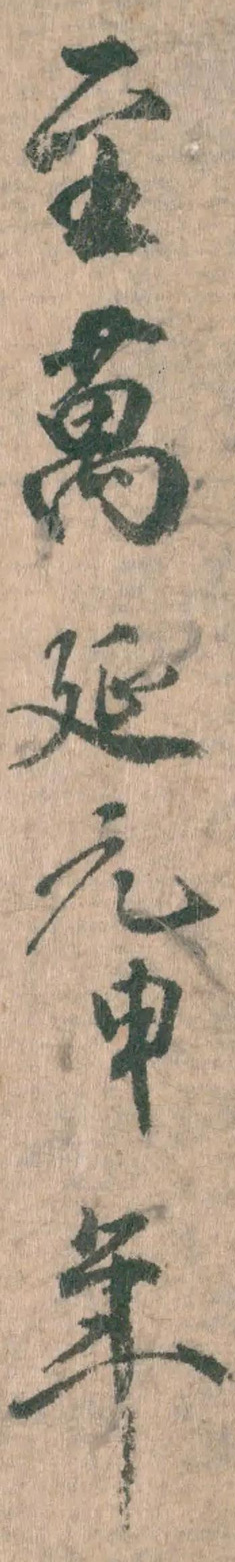至万延元申年
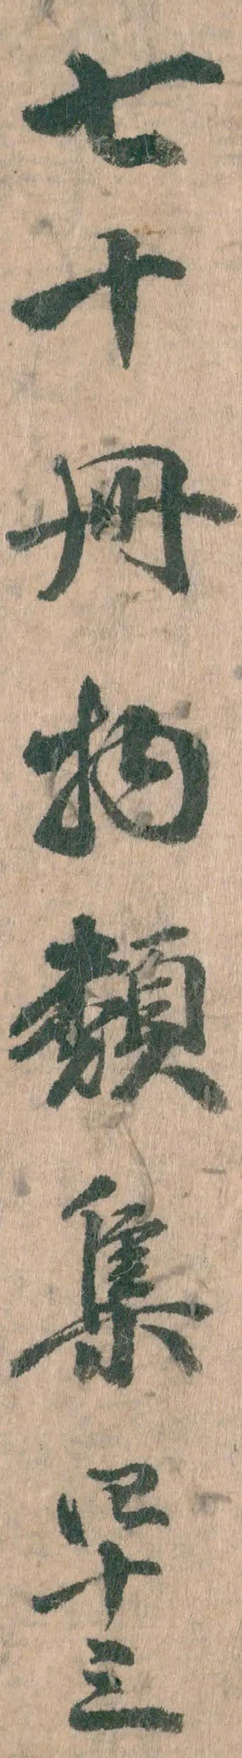七十冊物類集四十三

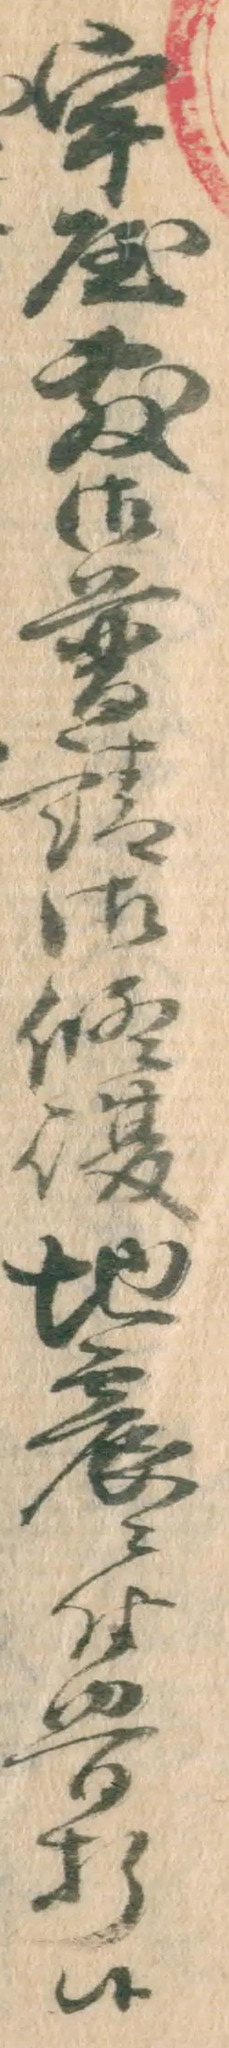牢屋敷御普請御修復地震ニ付骨折候
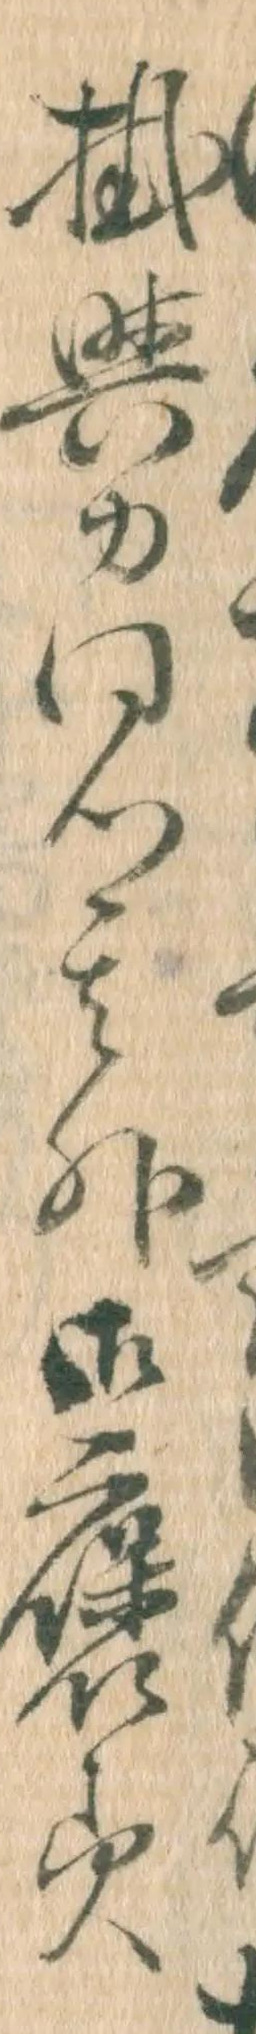掛与力同心其外御褒美

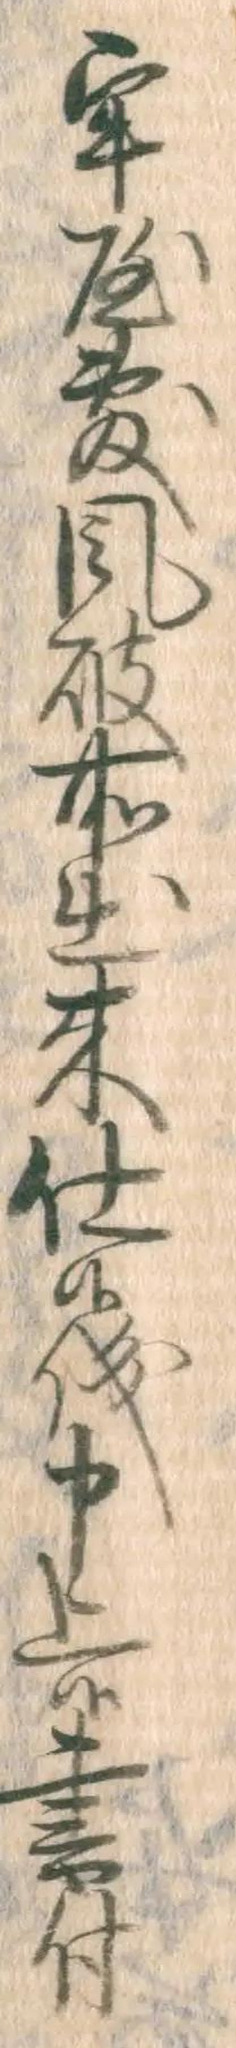│牢屋敷風破所出来仕候儀申上候書付
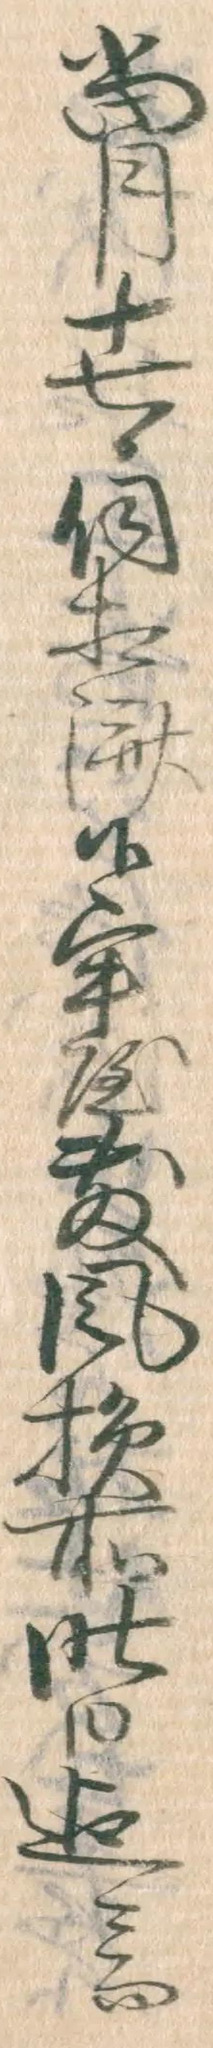当月十七日伺相済候牢屋敷風損所昨日迄ニて
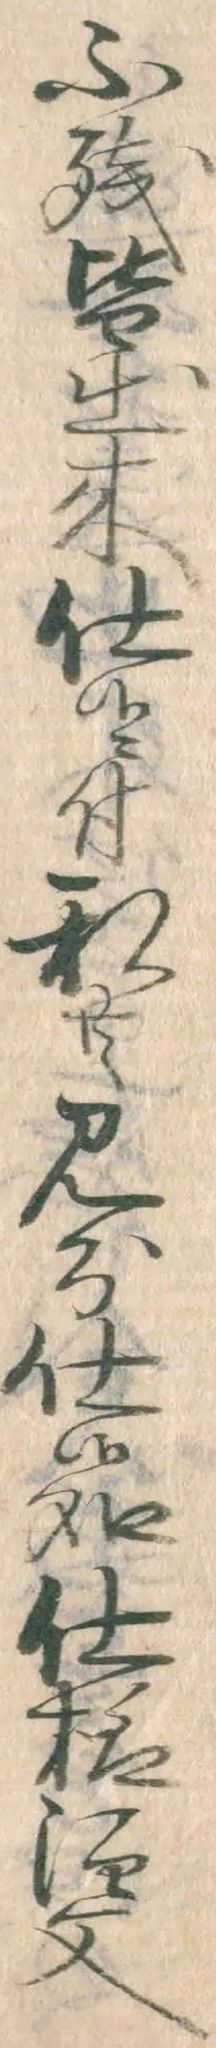不残皆出来仕候ニ付私共見分仕候処仕様注文

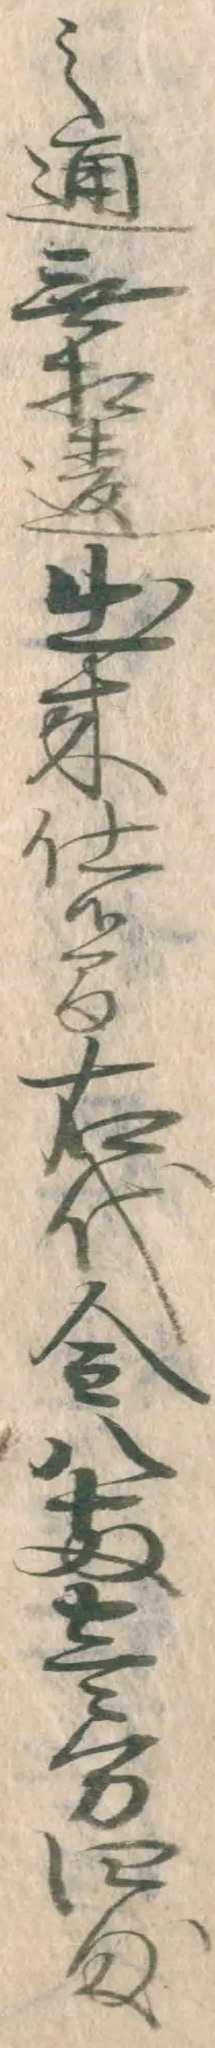之通無相違出来仕候間右代金八両壱分四匁
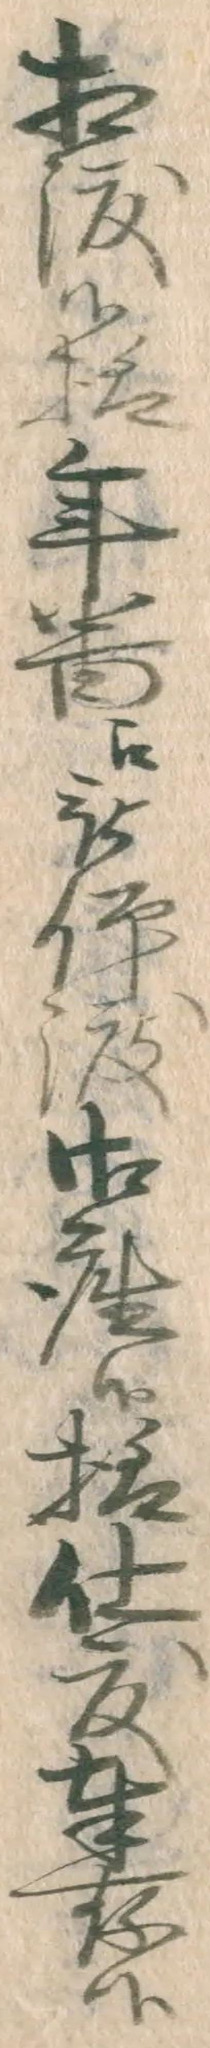相渡候様年番え被仰渡御座候様仕度奉存候
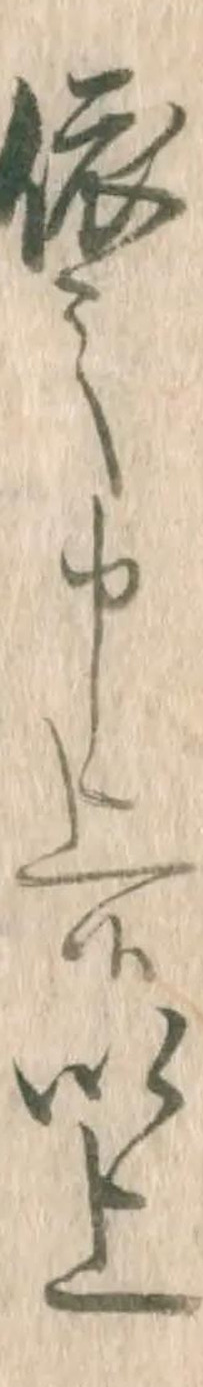依之申上候以上
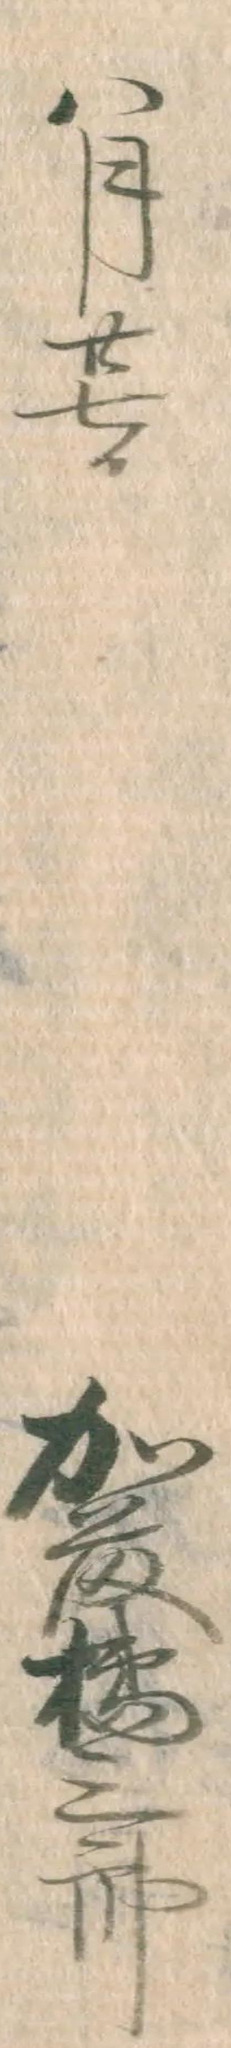八月廿七日加藤橘三郎
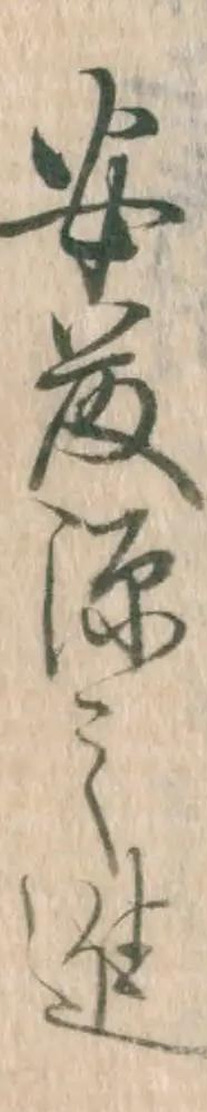安藤源之進
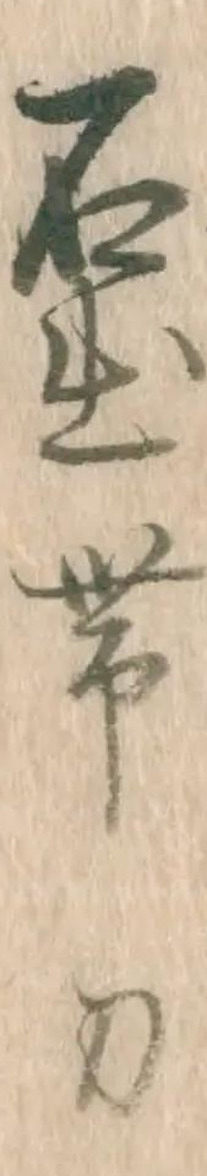石出帯刀
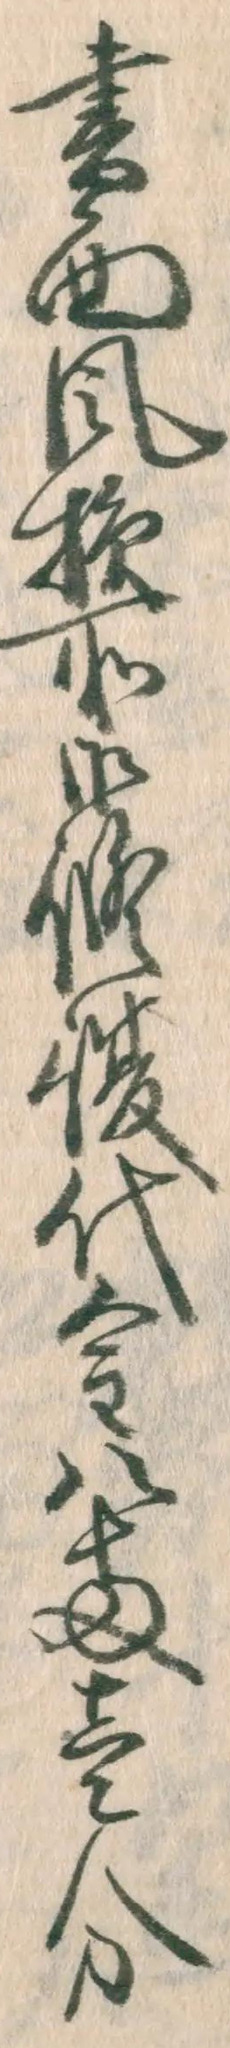書面風損所御修復代金八両壱分
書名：七十冊物類集 71巻. [44] 四十三 牢屋敷御普請御修覆地震ニ付骨折候牢屋掛御褒美之部
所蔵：国立国会図書館 National Diet Library, JAPAN
